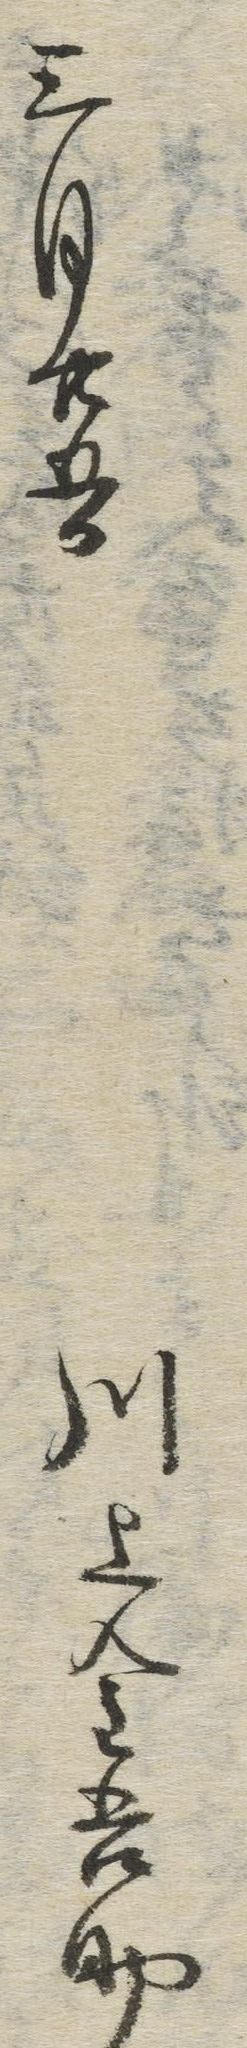三月廿五日川上金吾助
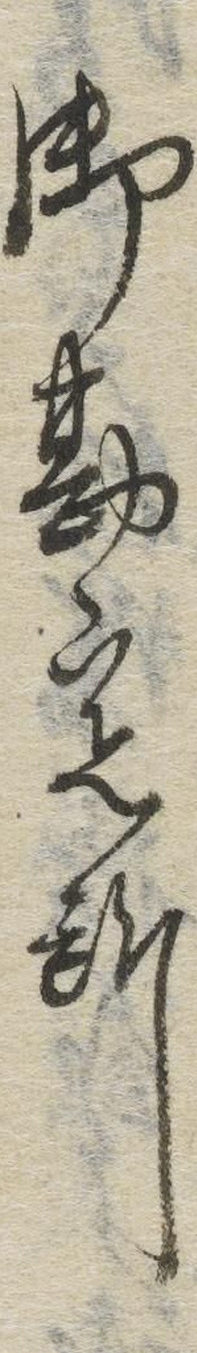御勘定所
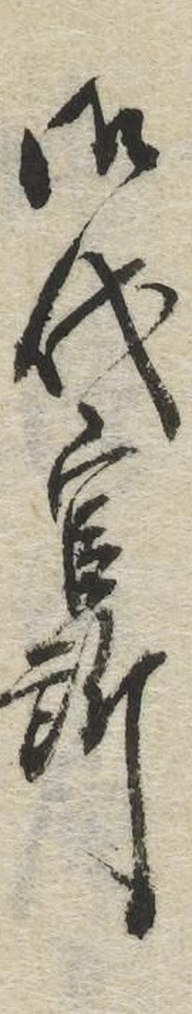御代官所
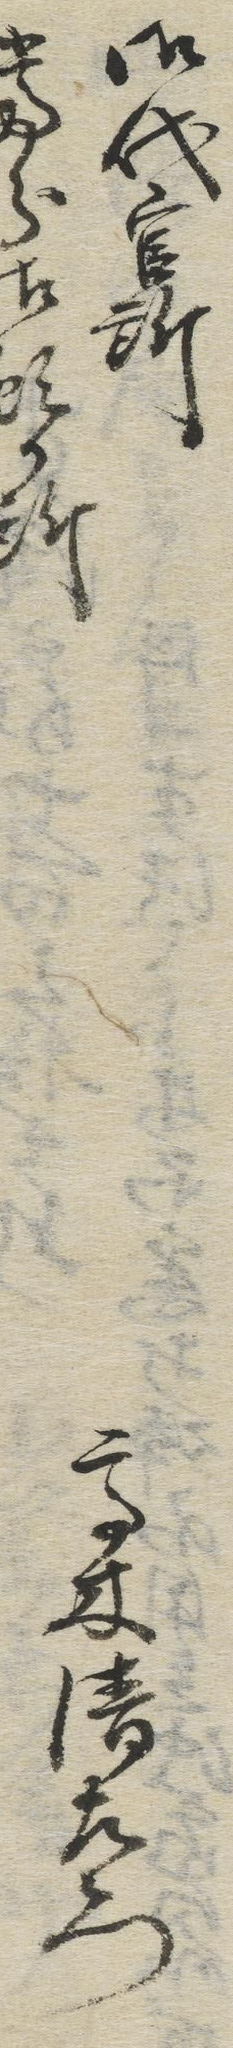当分御預り所高木清左衛門
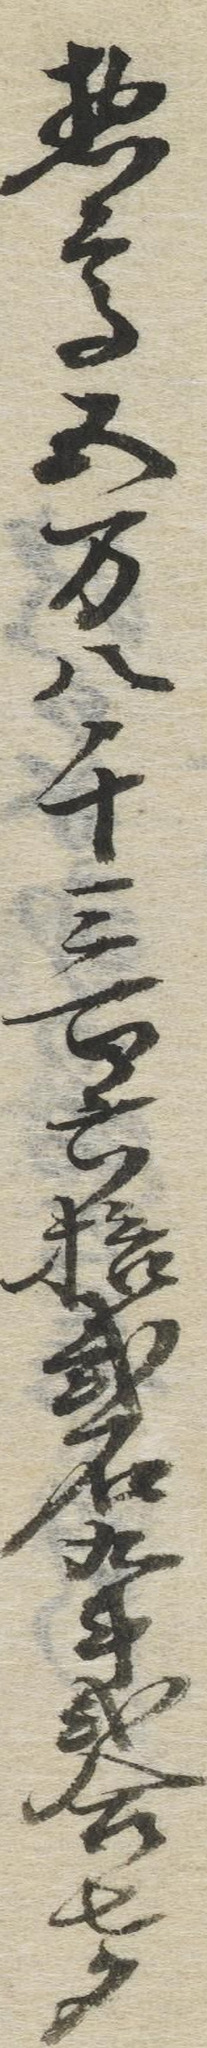惣高五万八千三百六拾弐石九斗弐合七夕
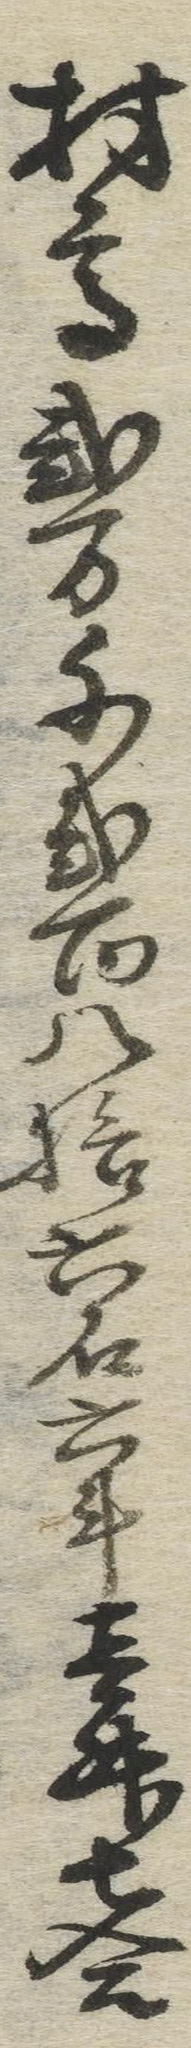村方弐万千弐百八拾六石六斗壱升七合
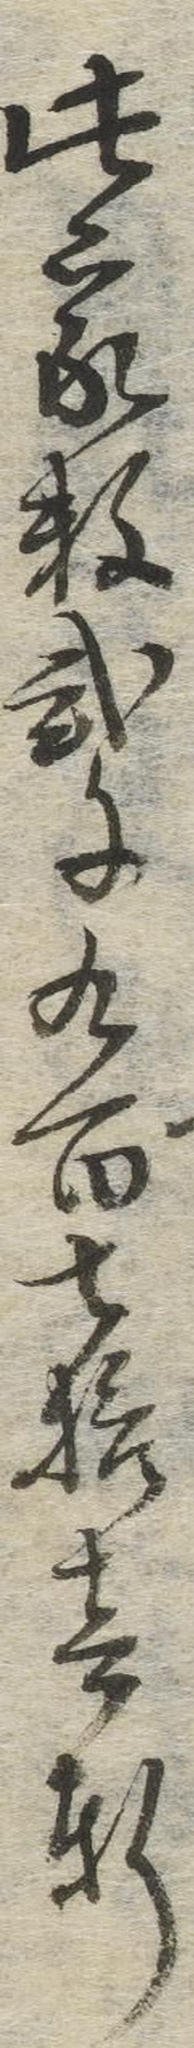此家数弐千九百七拾壱軒

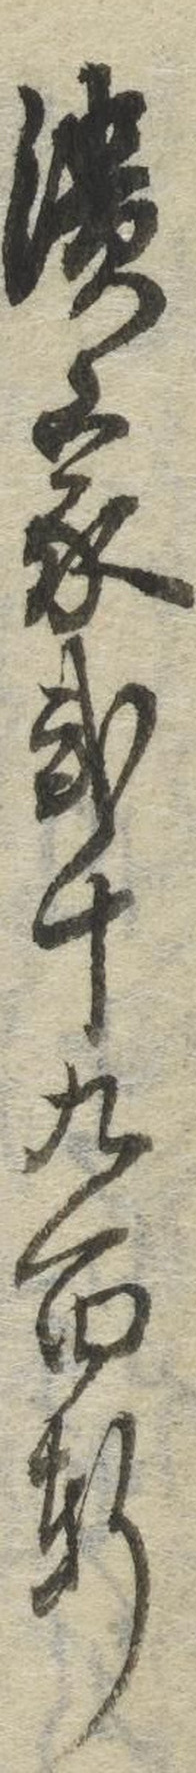一潰家弐千九百軒
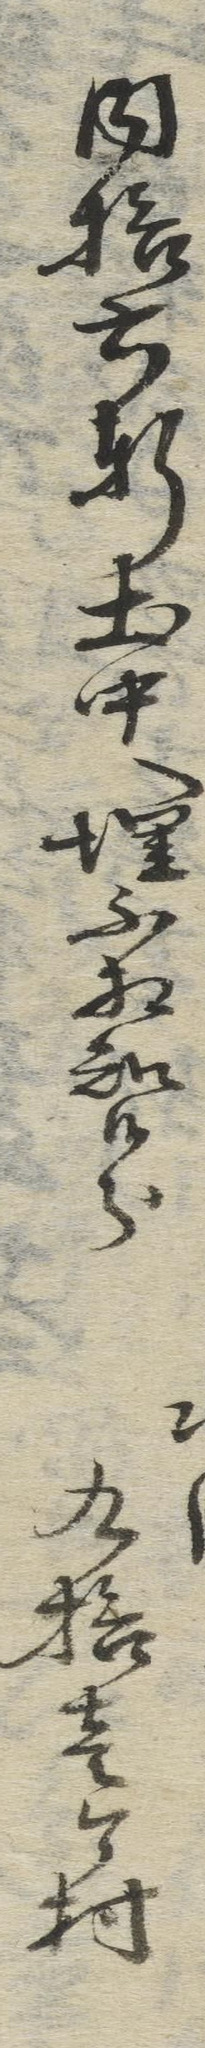内拾六軒土中へ埋不相知候分九拾壱ヶ村
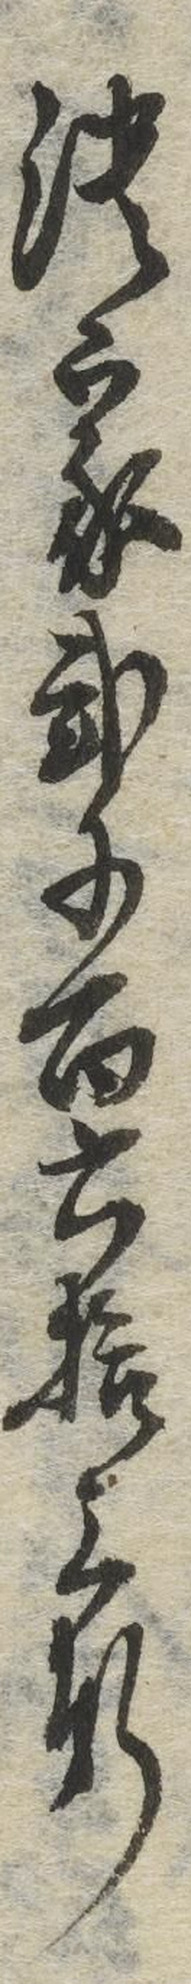潰家弐千百六拾三軒
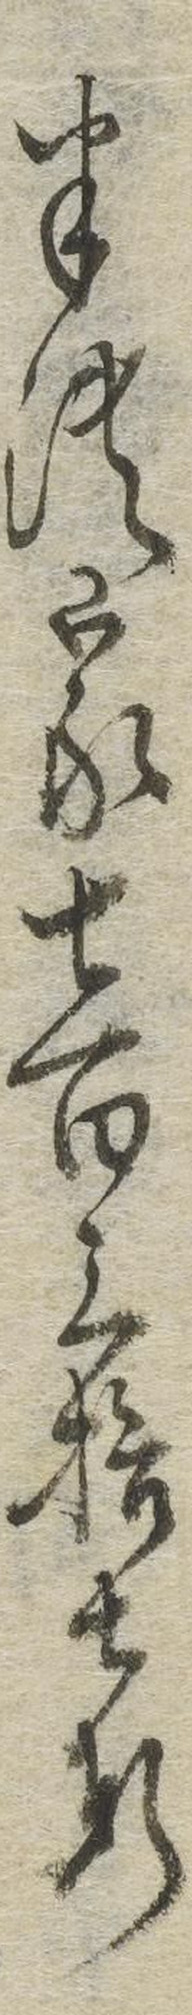半潰家七百三拾七軒
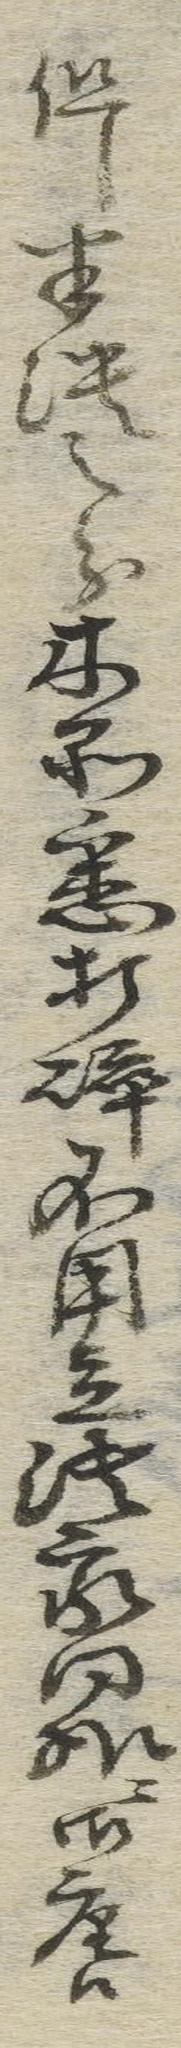但し半潰之分木品悉打砕不用立潰家同様二御座候
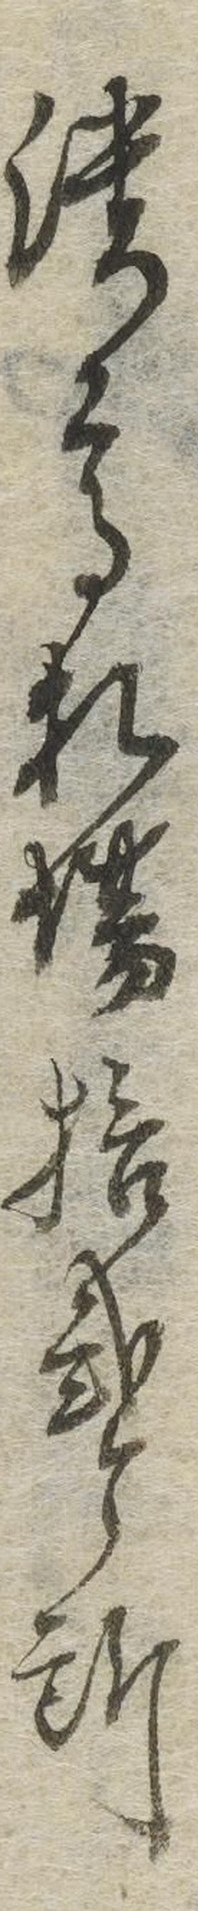潰高札場拾弐ヶ所
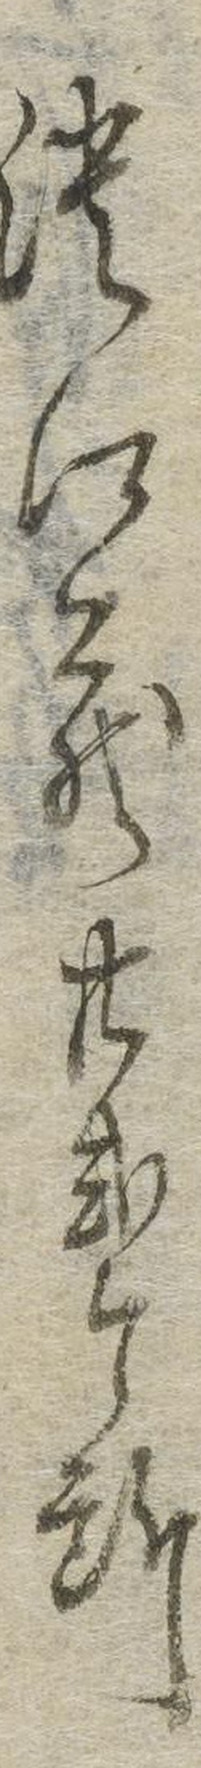潰郷蔵廿弐ヶ所
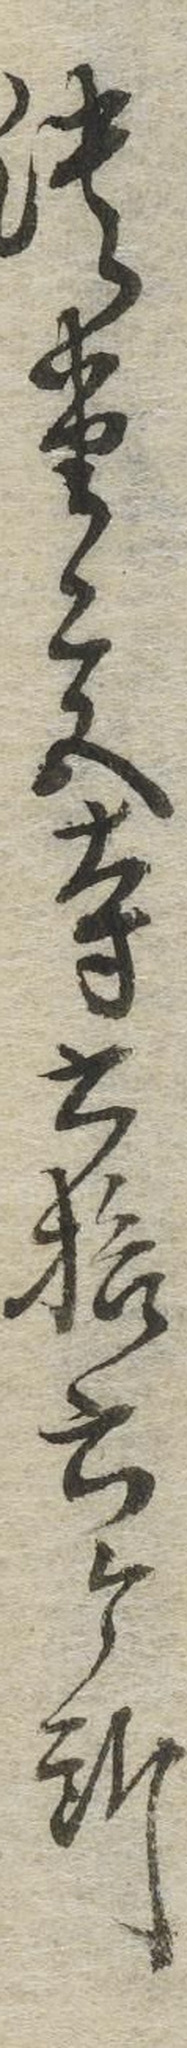潰堂宮寺六拾拾六ヶ所
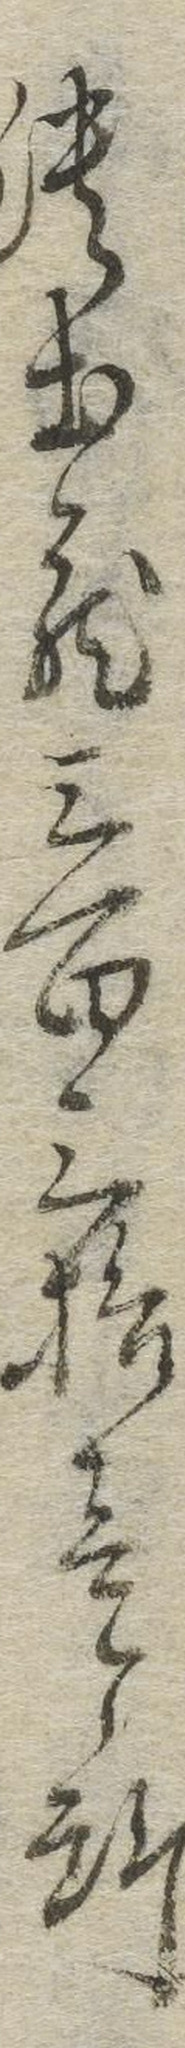潰土蔵三百三拾壱ヶ所
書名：信濃越後　地震書留
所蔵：東京大学地震研究所図書室 Earthquake Research Institute Library, The University of Tokyo, JAPAN
